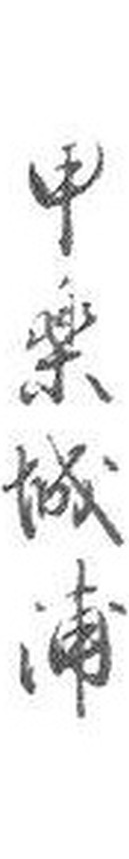甲樂城浦
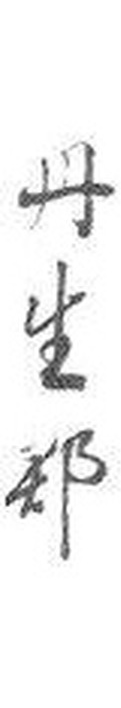丹生郡
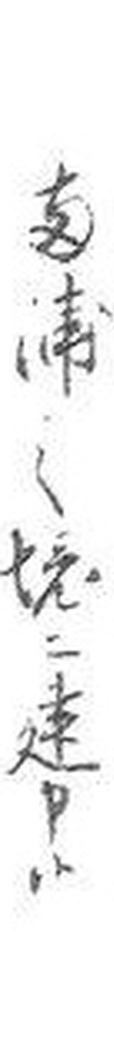両浦之境ニ建申候
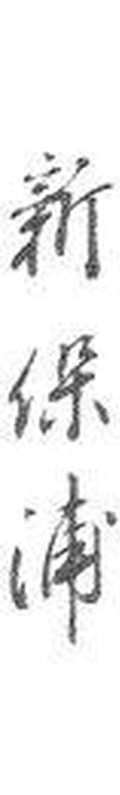新保浦
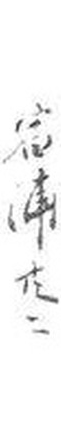宿浦共ニ
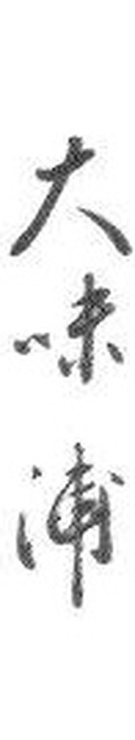大味浦
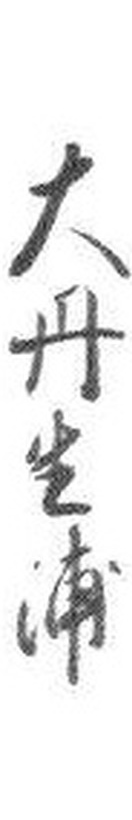大丹生浦
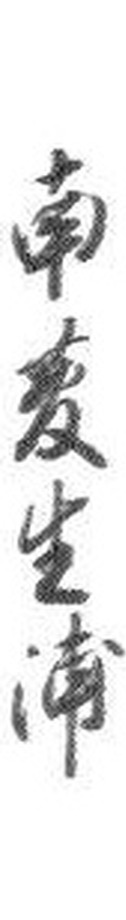南菅生浦
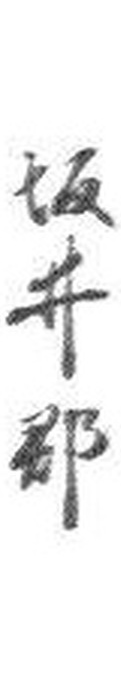坂井郡
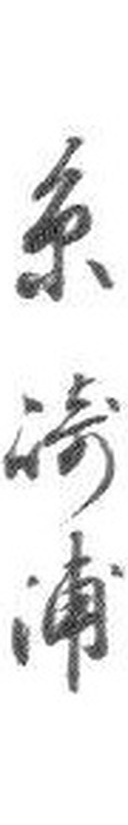糸崎浦
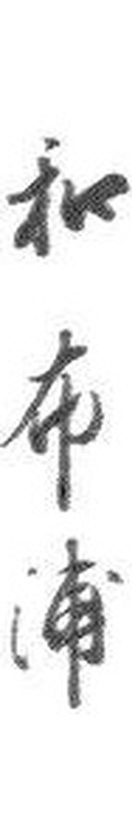和布浦
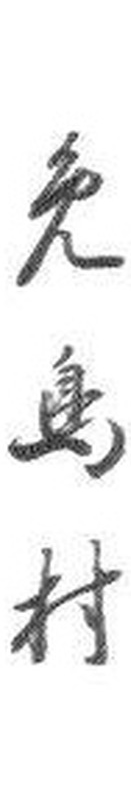免鳥村
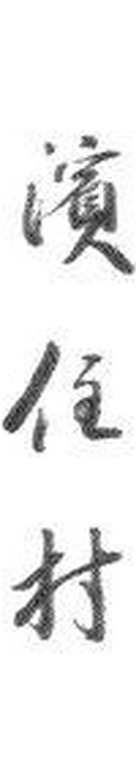濱住村
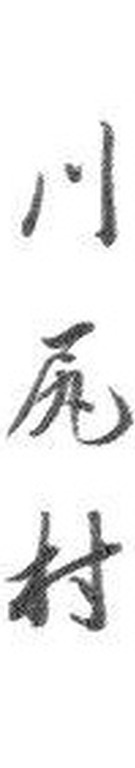川尻村
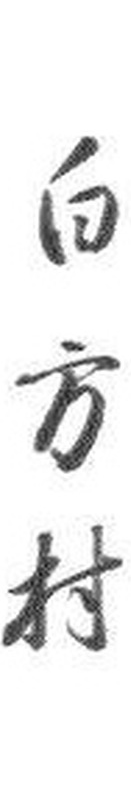白方村
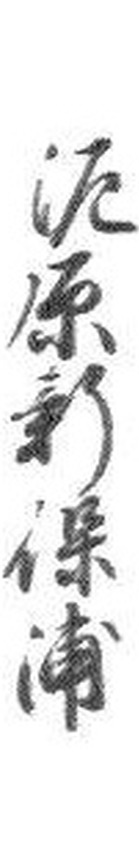泥原新保浦
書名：家譜 二十九 吉邦公 従正徳二年到正徳三年
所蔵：福井県文書館 Fukui Prefectural Archives
